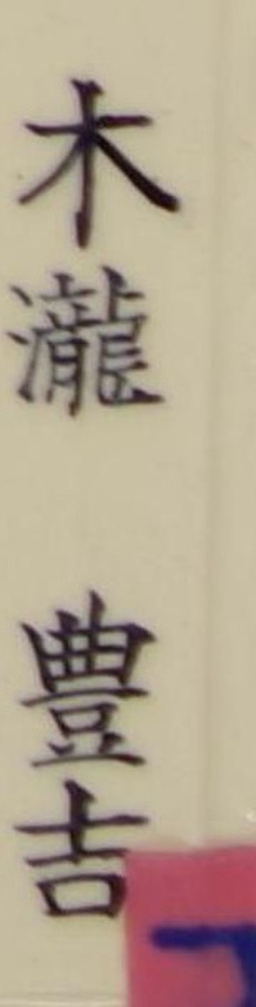木瀧豊吉
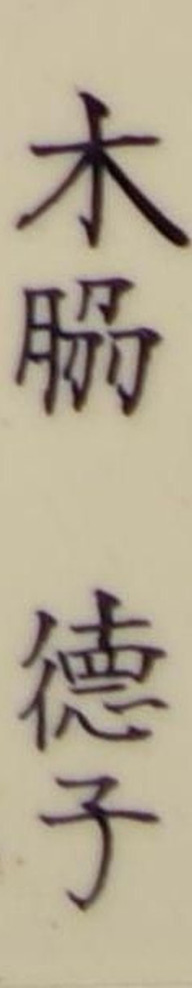木脇徳子
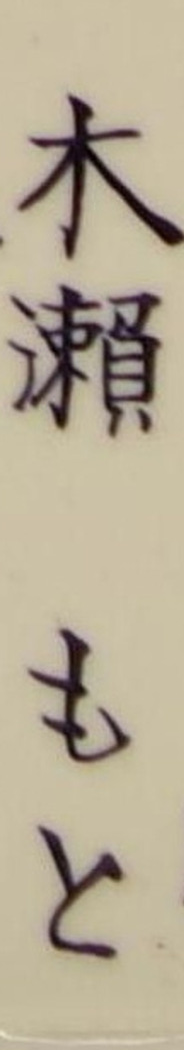木瀬もと
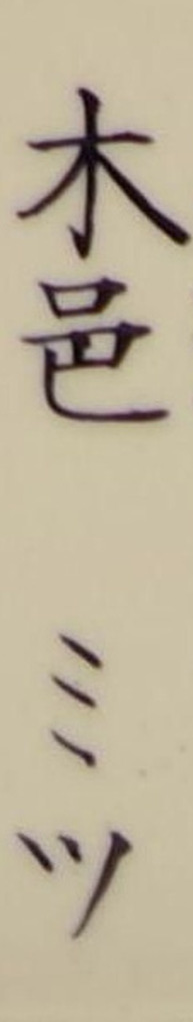木邑ミツ
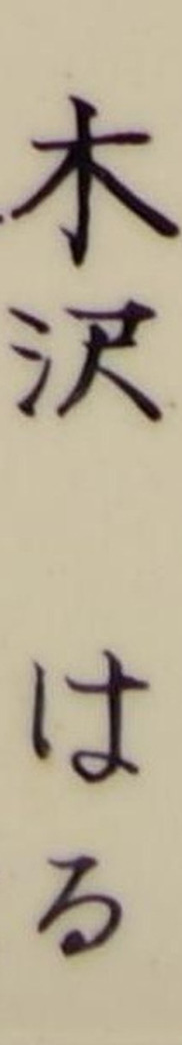木沢はる
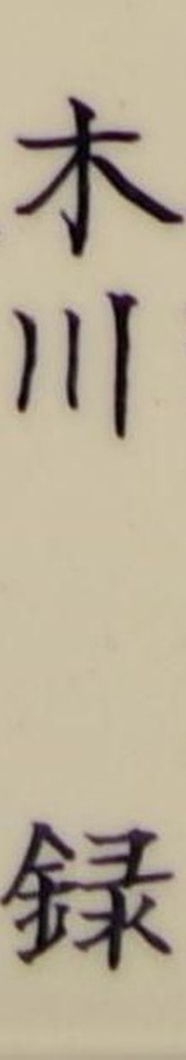木川録
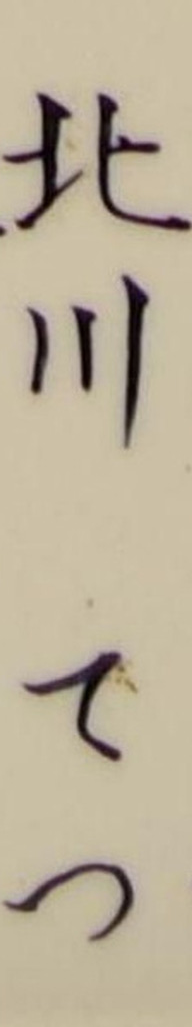北川てつ
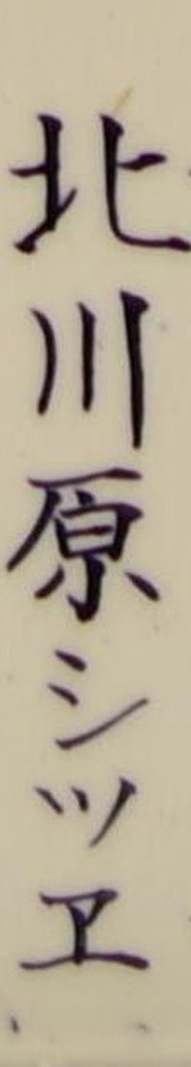北川原シツヱ
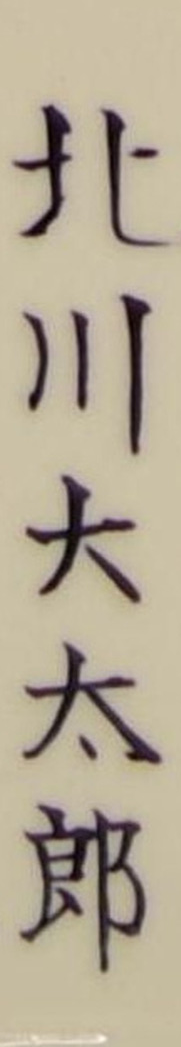北川大太郎
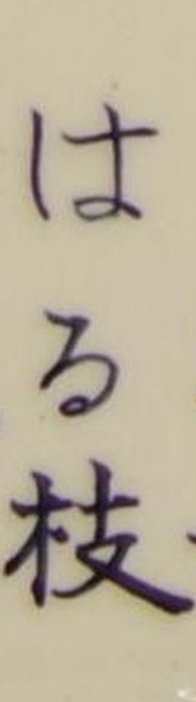はる枝
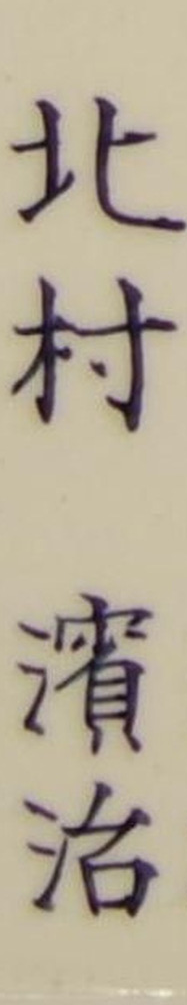北村濱治
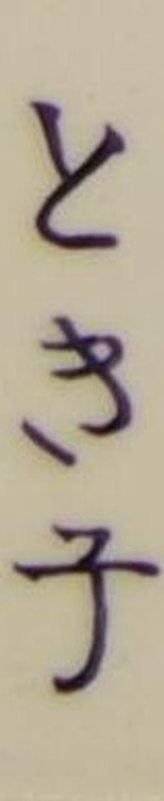とき子

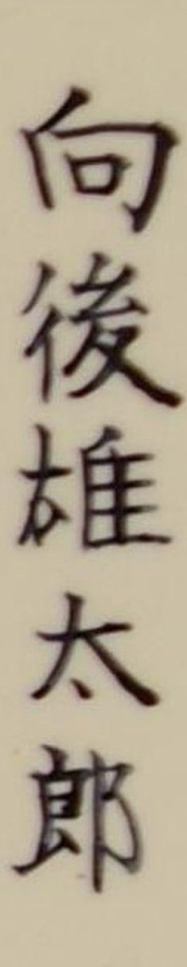向後雄太郎
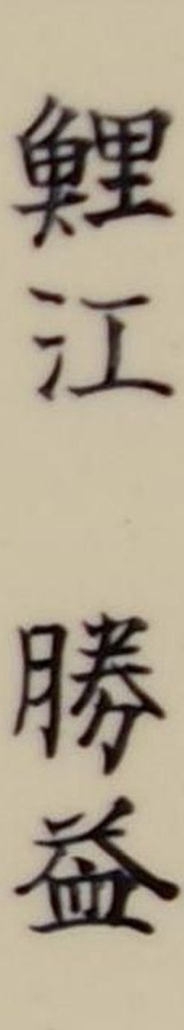鯉江勝益
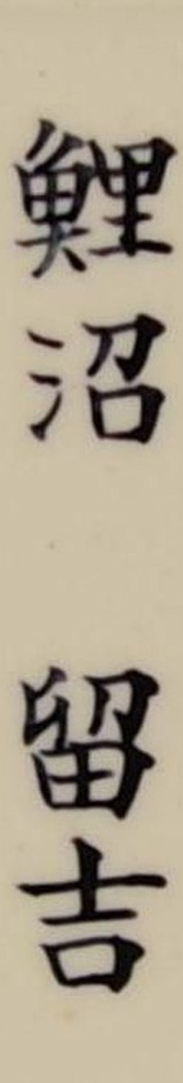鯉沼留吉
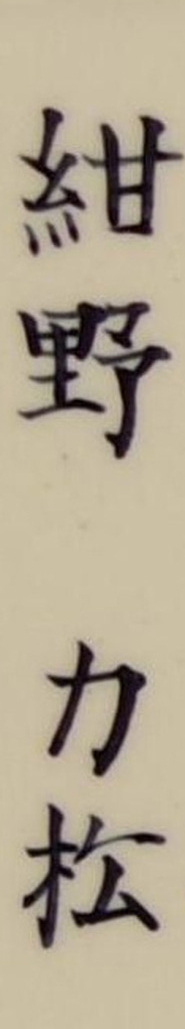紺野力松
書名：E~L
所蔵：高野山金剛峯寺
